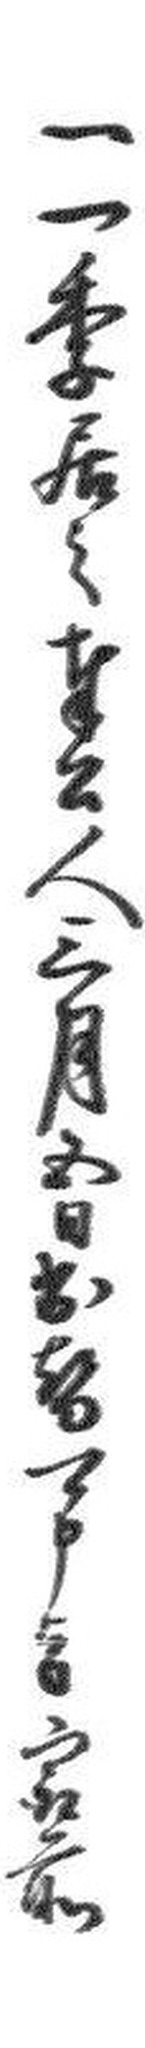一一季居之奉公人三月五日出替可申旨最前
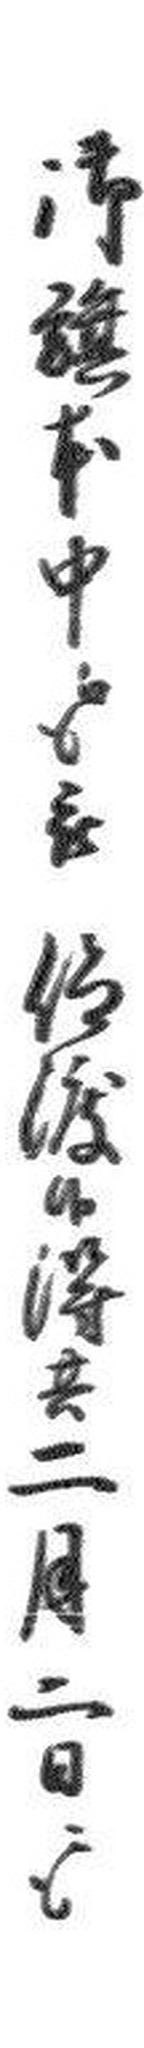御旗本中江も被仰渡候得共二月二日ニも
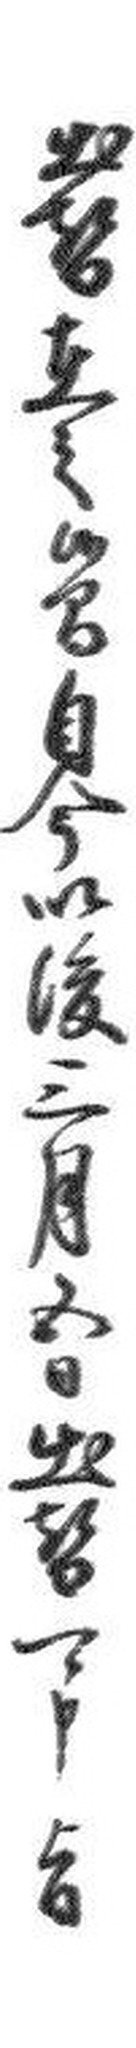出替在之候間自今以後三月五日出替可申旨

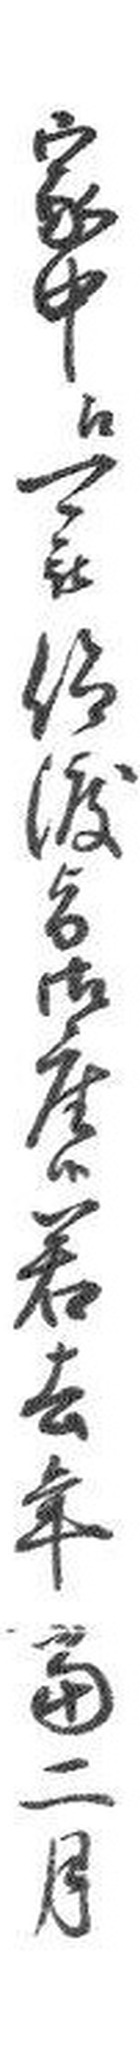家中江可被仰渡旨御座候若去年當二月
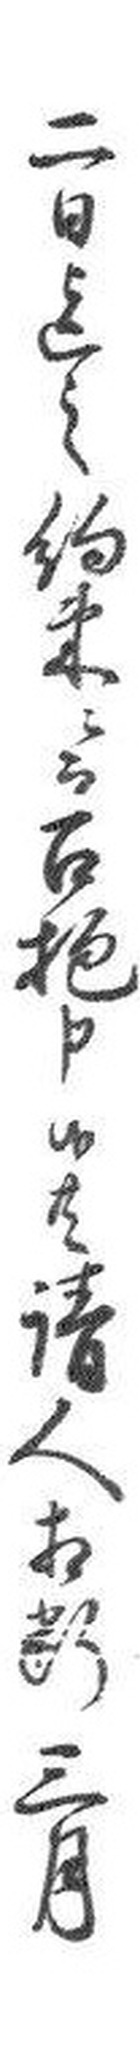二日迄之約束ニ而召抱申候共請人相断三月
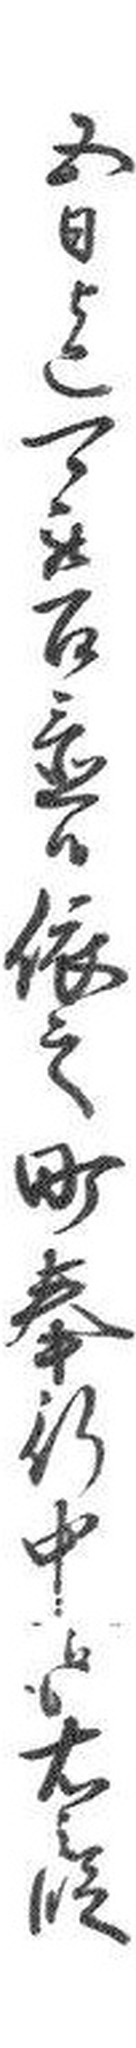五日迄可被召置候依之町奉行中江も右之段
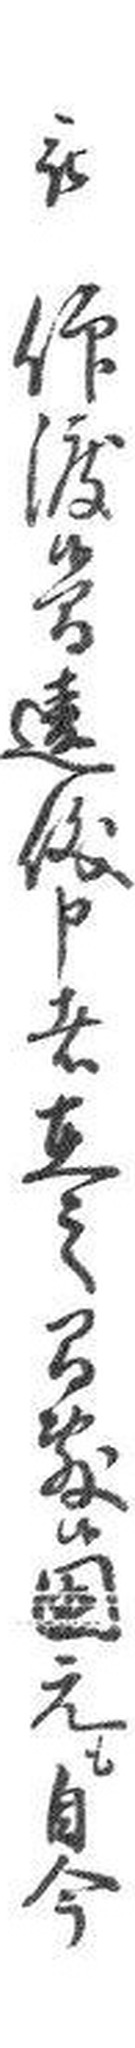被仰渡候間違儀申者在之間敷候国元も自今
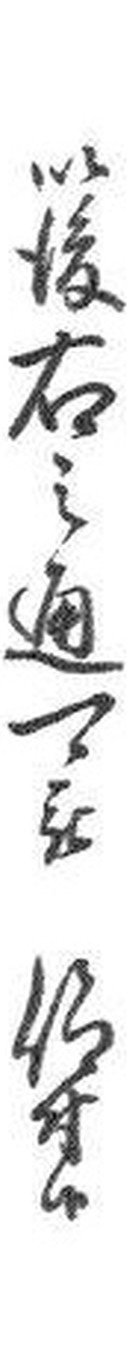以後右之通可被仰付候
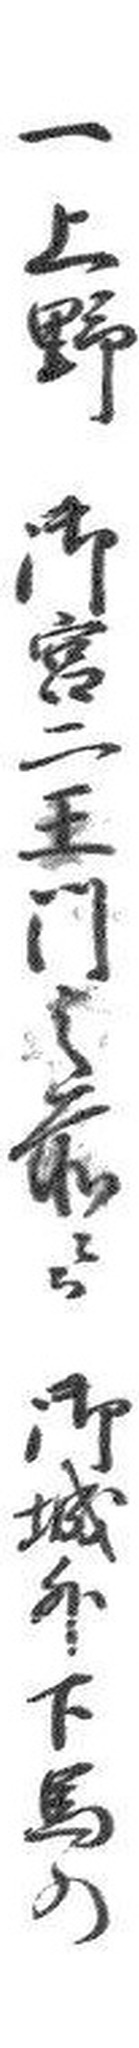一上野御宮二王門之前ニ而御城外下馬の
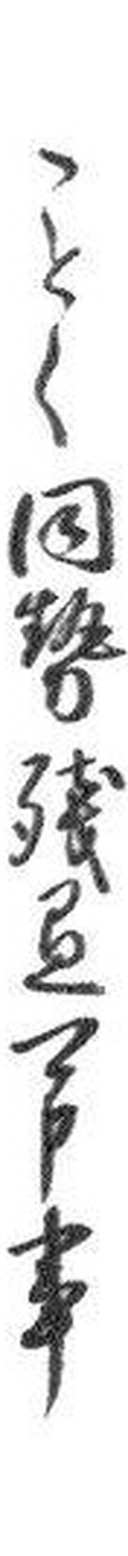ことく同勢残置可申事
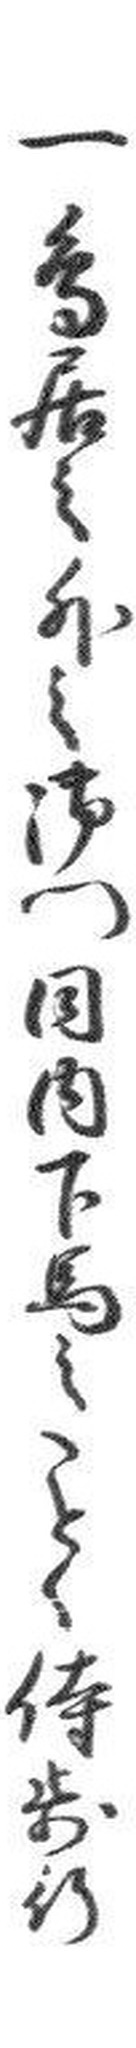一鳥居之外之御門同内下馬之ことく侍歩行
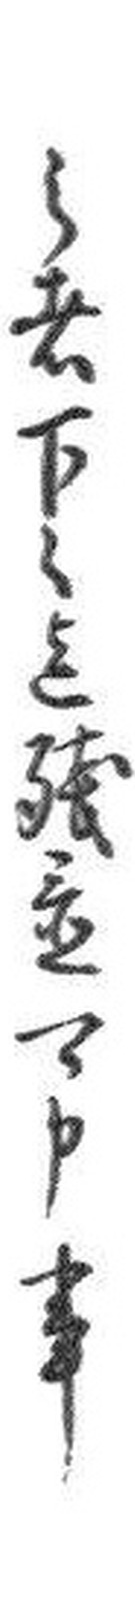之者下々迄残置可申事
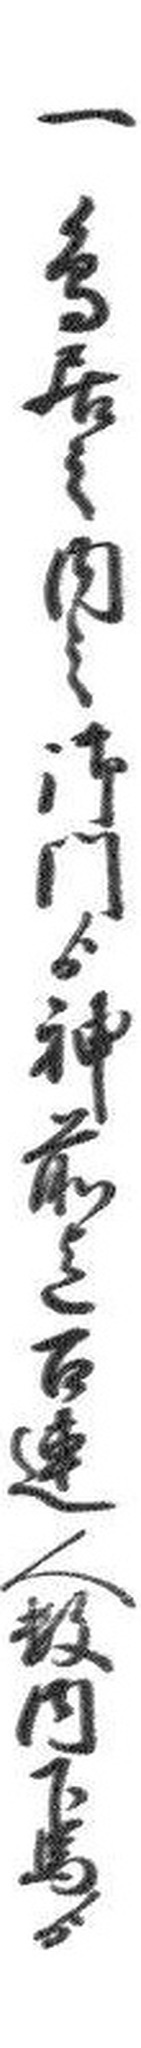一鳥居之内之御門ゟ神前迄召連人数内下馬ゟ
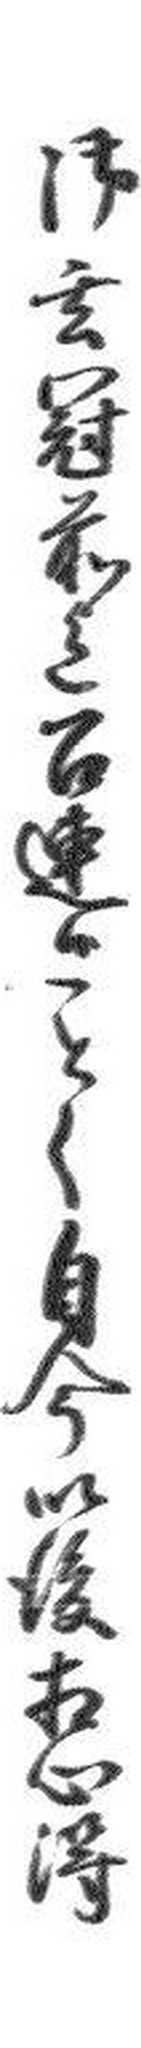御玄冠前迄召連候ことく自今以後相心得
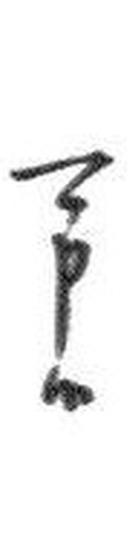可申候
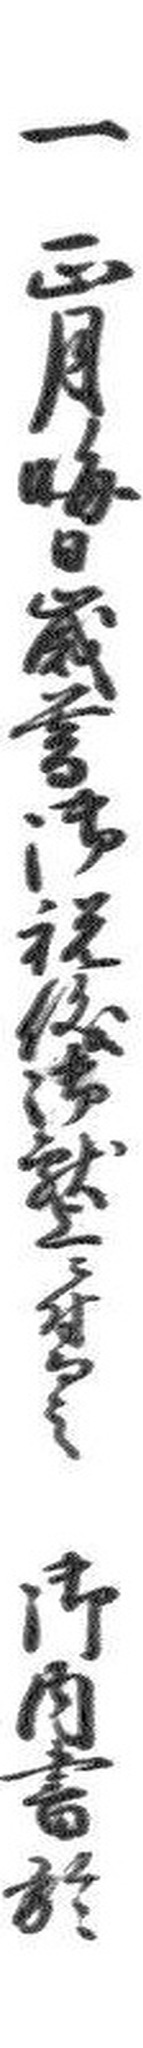一正月晦日歳暮御祝儀御献上ニ付而者御内書於
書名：家譜 八 光通公 従寛文十年到同十二年
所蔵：福井県文書館 Fukui Prefectural Archives
